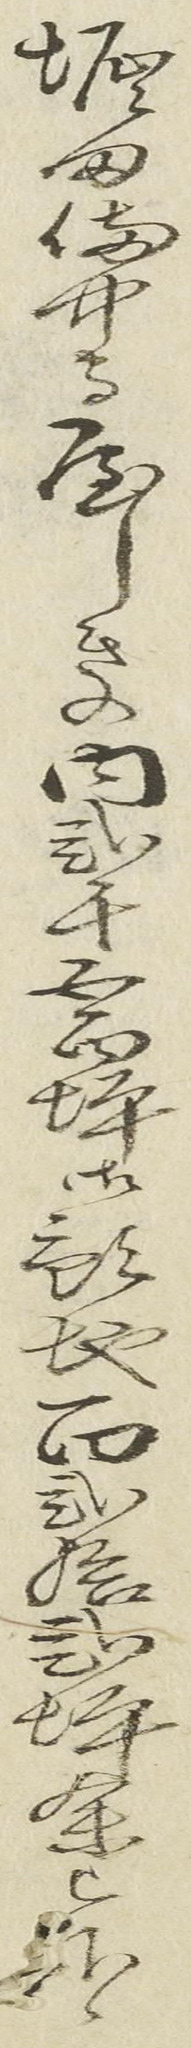堀田備中守屋しきの内弐千五百坪御預地百弐拾弐坪余被下候
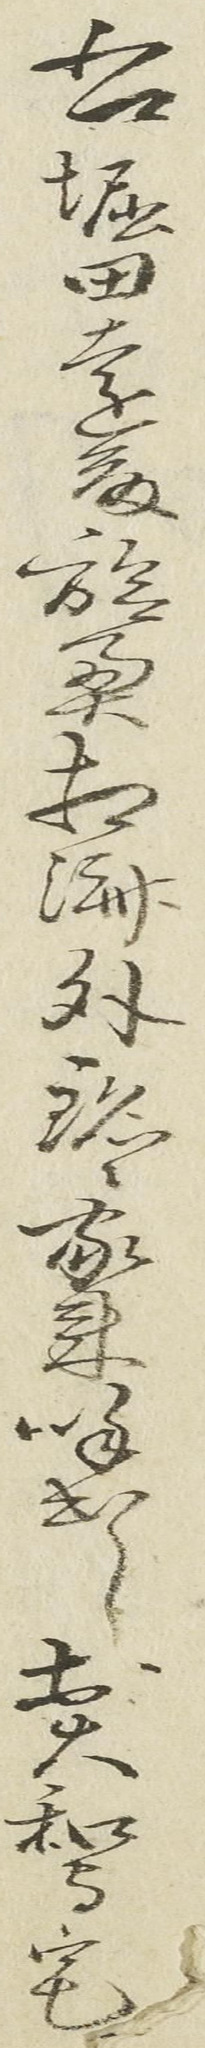右堀田遠藤於奥相済外銘々家来呼出し於大和守宅
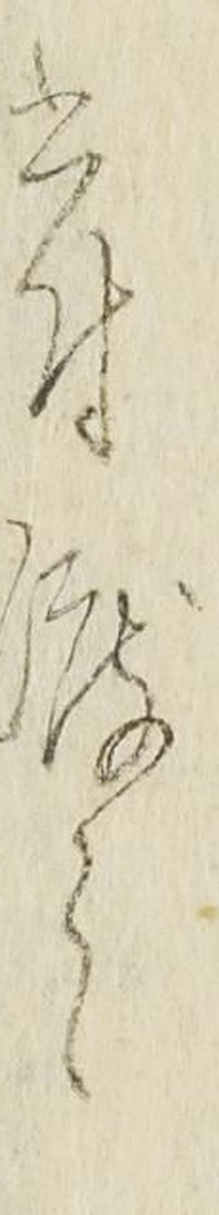書付渡候
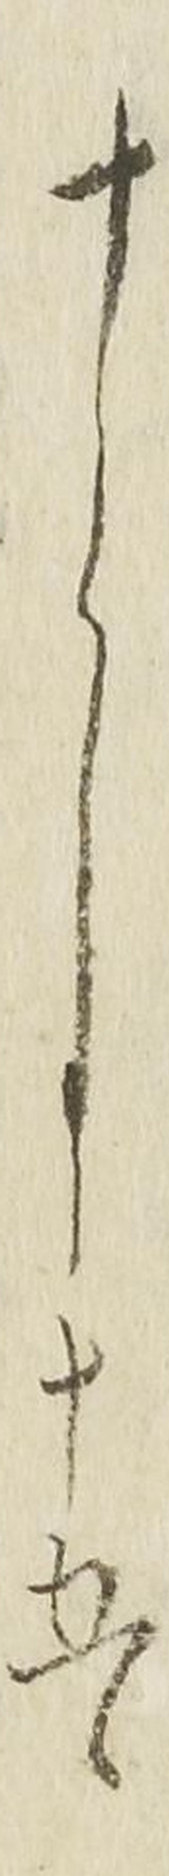十月十五日
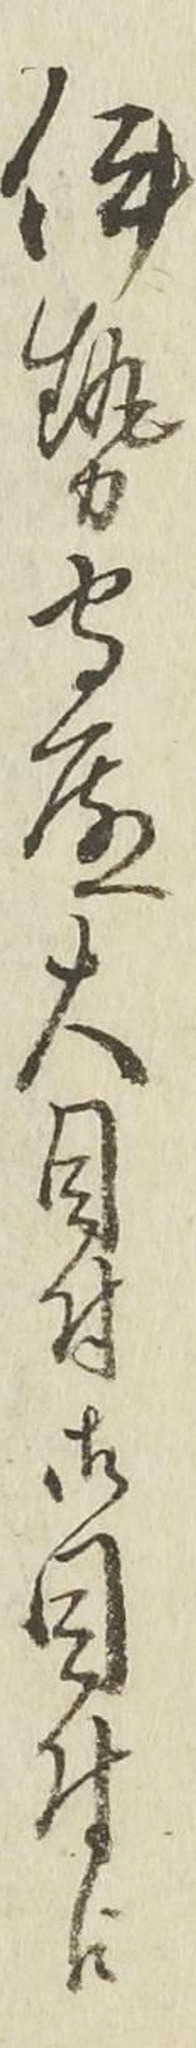伊勢守殿大目付御目付え
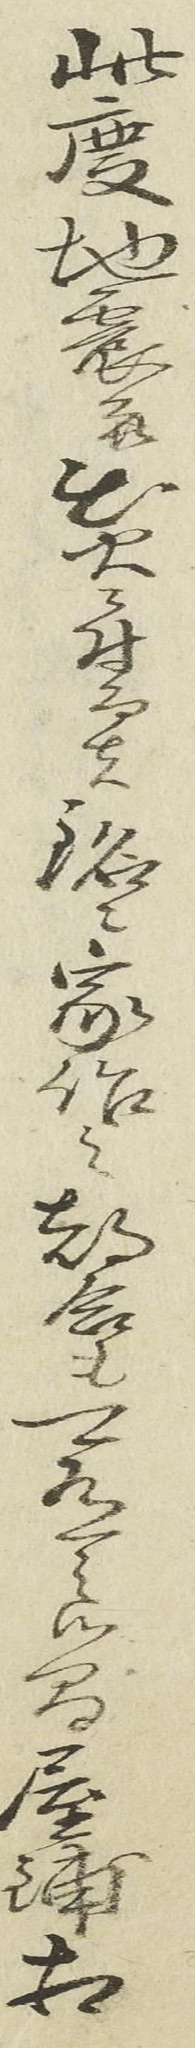此度地震幷出火ニ付而は銘々家作之都合も可有之候間屋鋪相
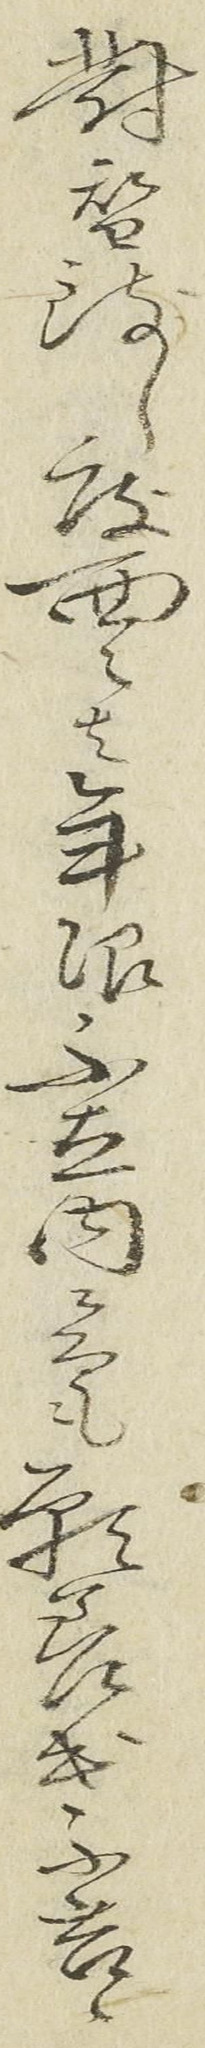対替致し度面々は年限不立内ニ而も願差出不苦候

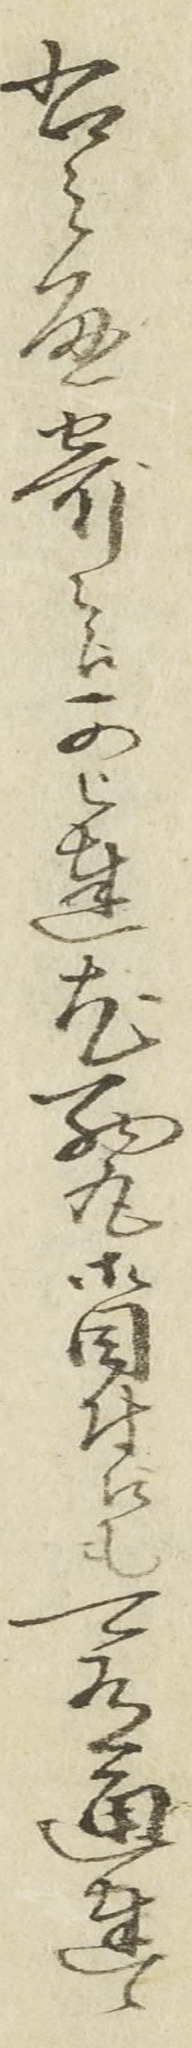右之通寄々え可被達尤西丸御目付えも可有通達候
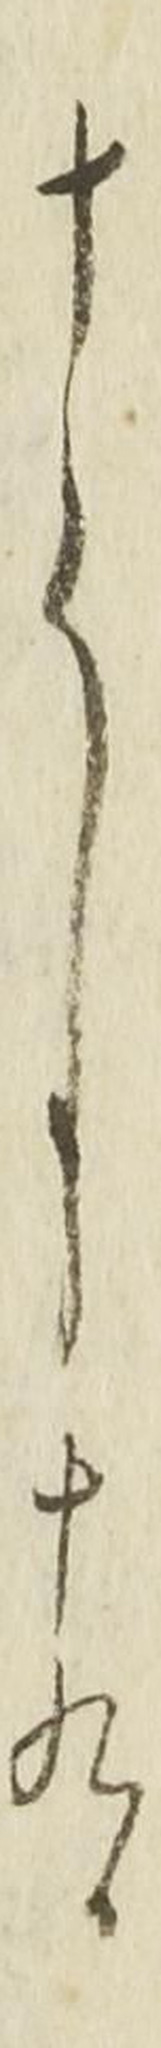十月十九日
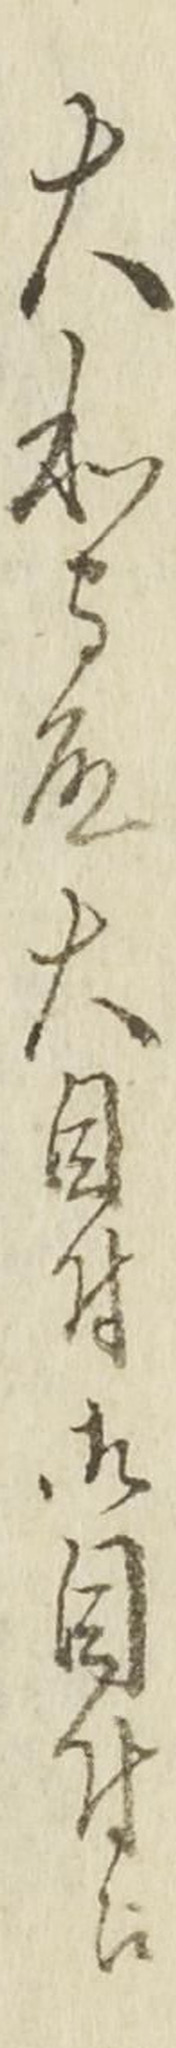大和守殿大目付御目付え
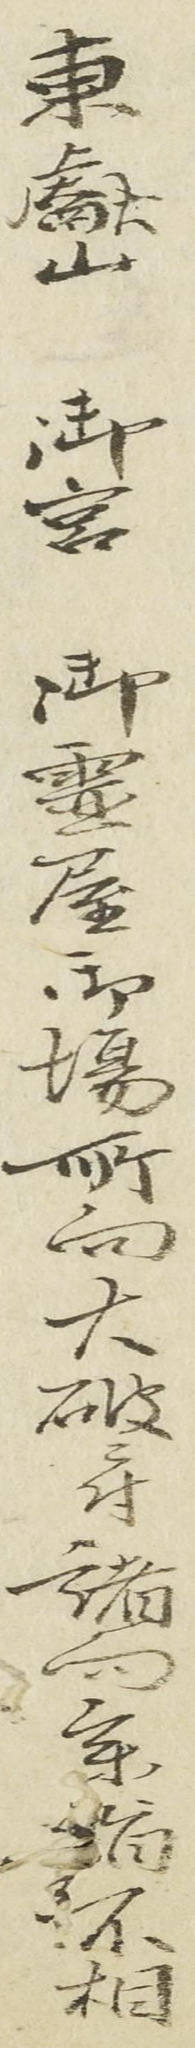東叡山御宮御霊屋御場所向大破ニ付諸向参詣不相
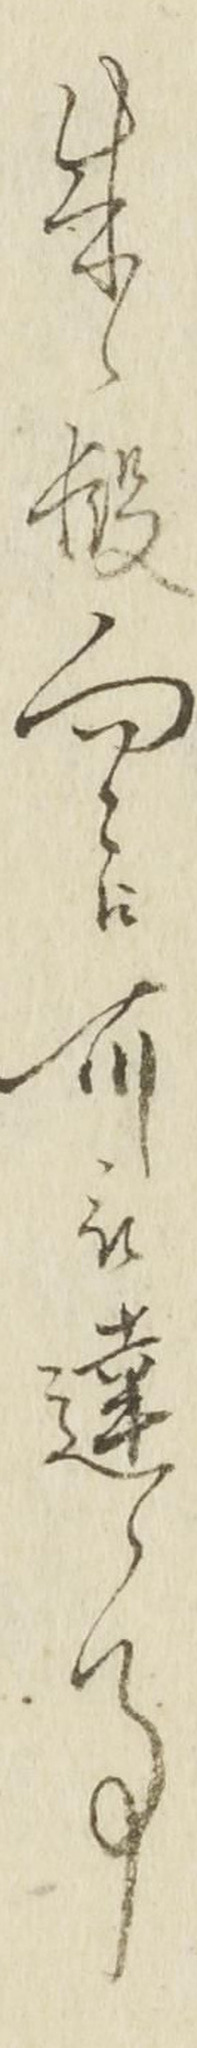成候段向々え可被達候事
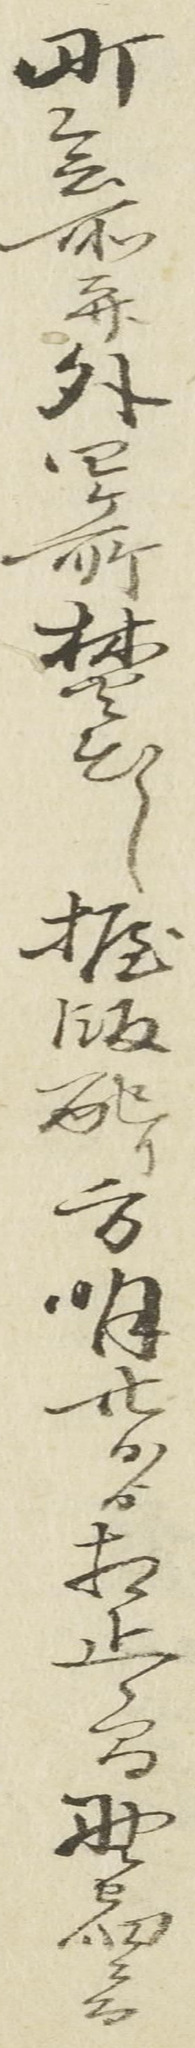町会所幷外四ヶ所焚出し握飯配り方明く廿日ゟ相止候間野宿ニ而
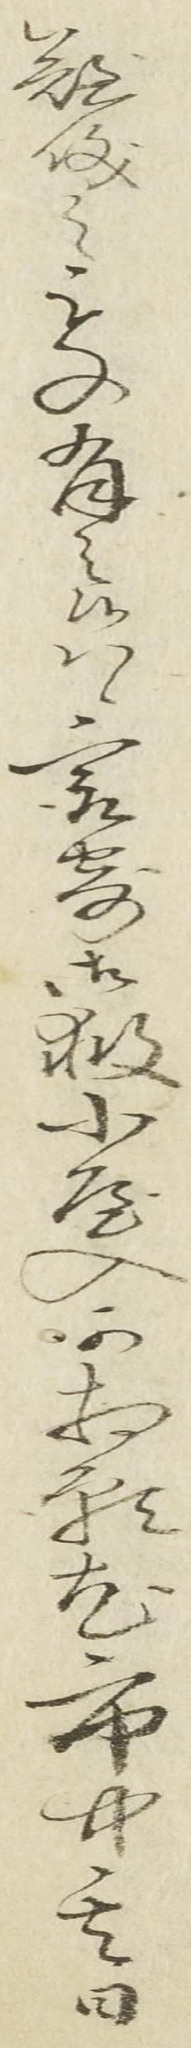難儀之もの有之候ハゝ最寄御救小屋入可相願尤市中其日
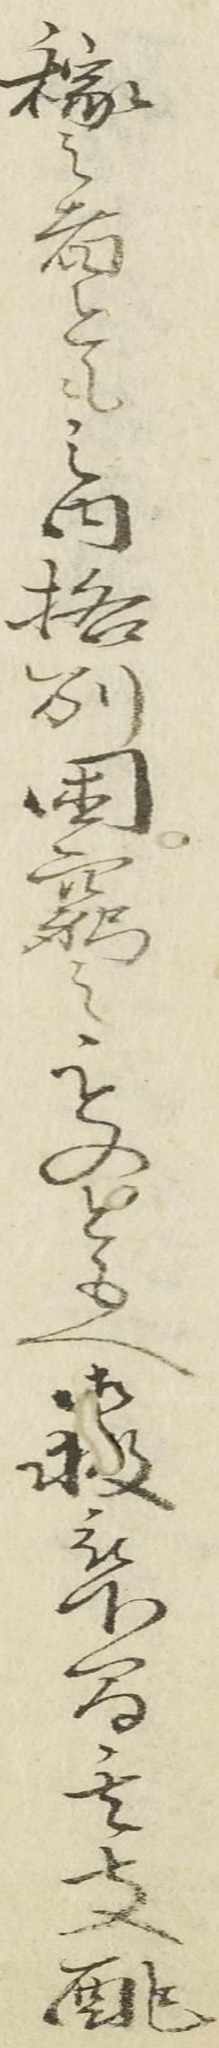稼之者とも之内格別困窮之ものどもへ御救被下間其支配
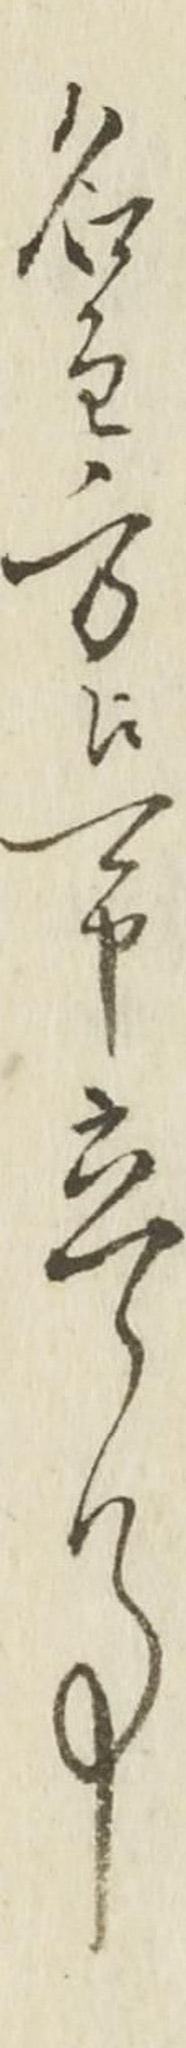名主方え可申立候事
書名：安政二乙卯年十月二日大地震之事
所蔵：東京大学地震研究所図書室 Earthquake Research Institute Library, The University of Tokyo, JAPAN
